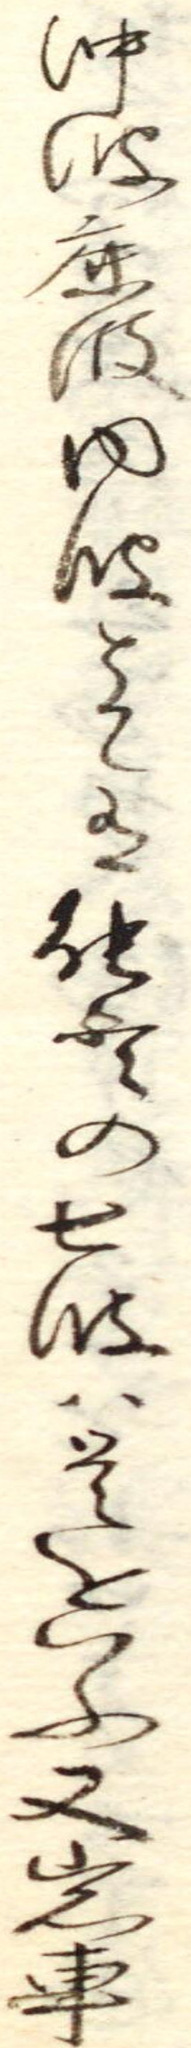沖波鹿波内波とて有能登の七波は是をいふ又岩車
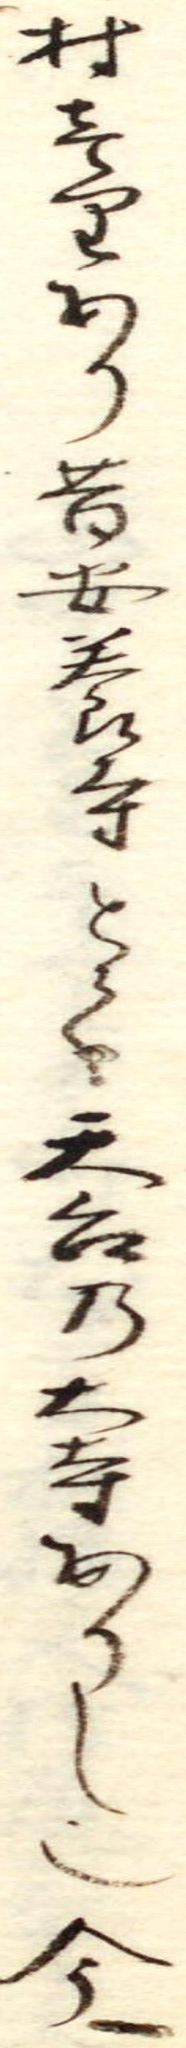村壱里あり昔安養寺とて天台の大寺ありし也今
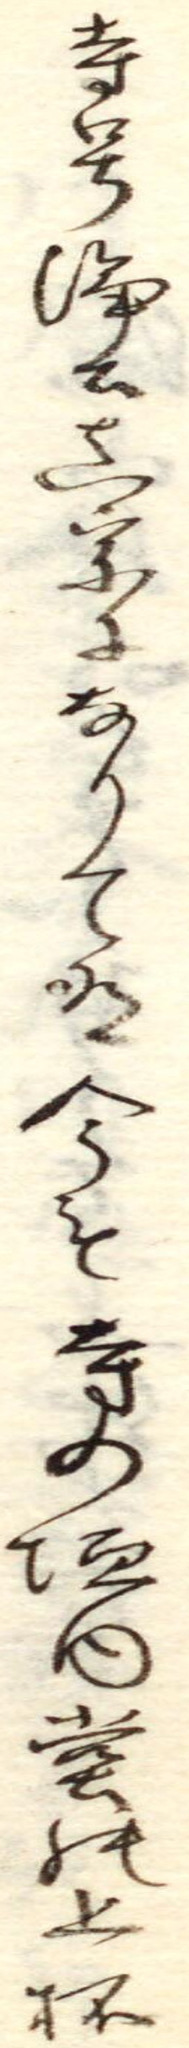寺号浄土真宗にありて有今も寺の垣内堂の上抔
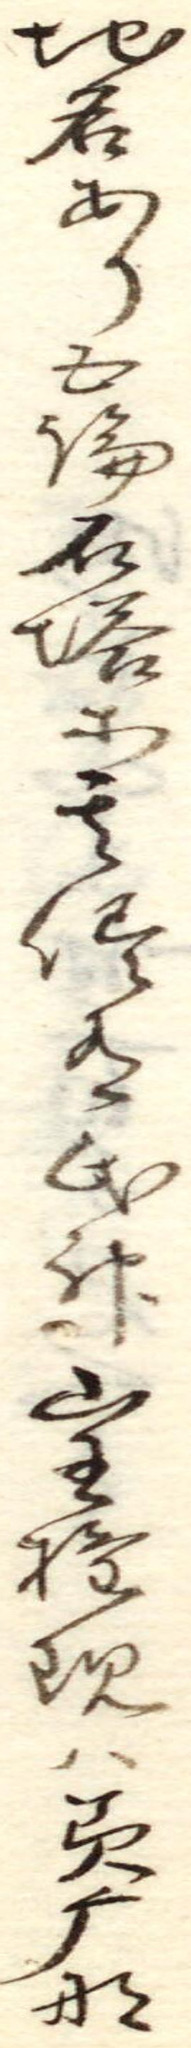地名あり五輪石塔抔其侭有氏神山王権現は美麻那
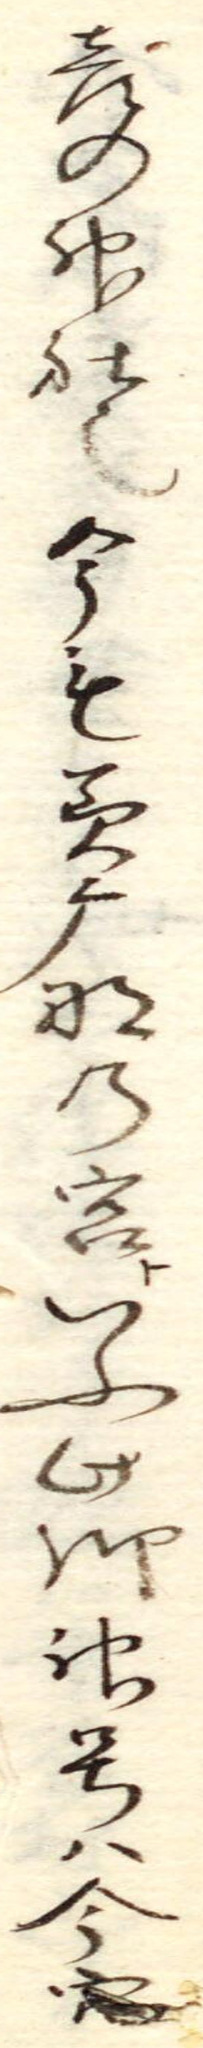彦の神社也今も美麻那の宮といふ此御神号は今穴
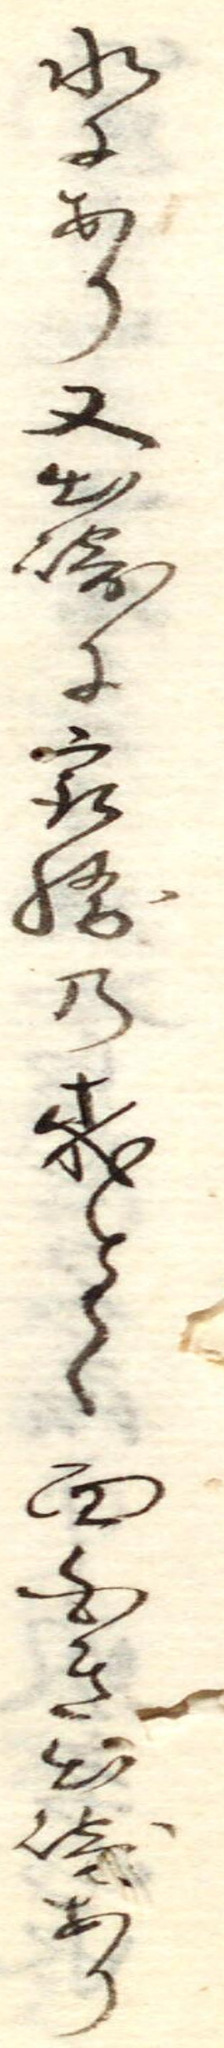水にあり又出崎に最勝の森とて面白き出崎あり
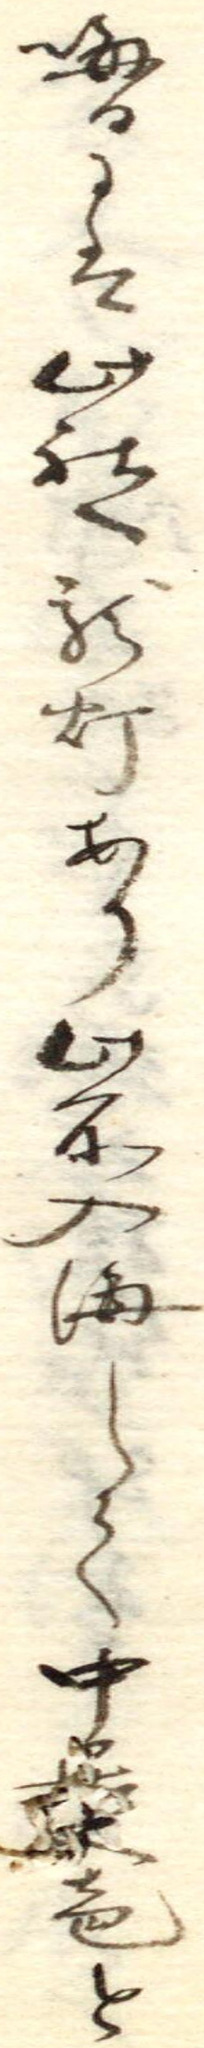晦日には此社へ龍灯あり此所入海して中色と
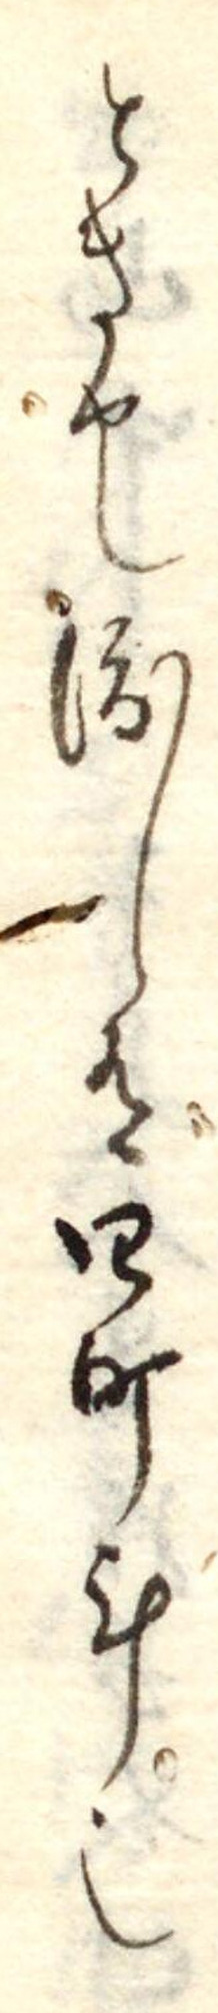とき申し渡し有四町斗也

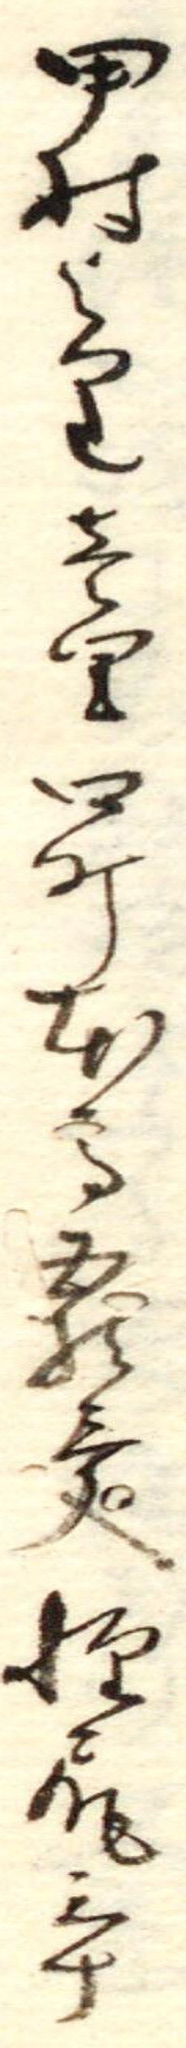甲村より壱里四町本馬五拾三文軽尻三十
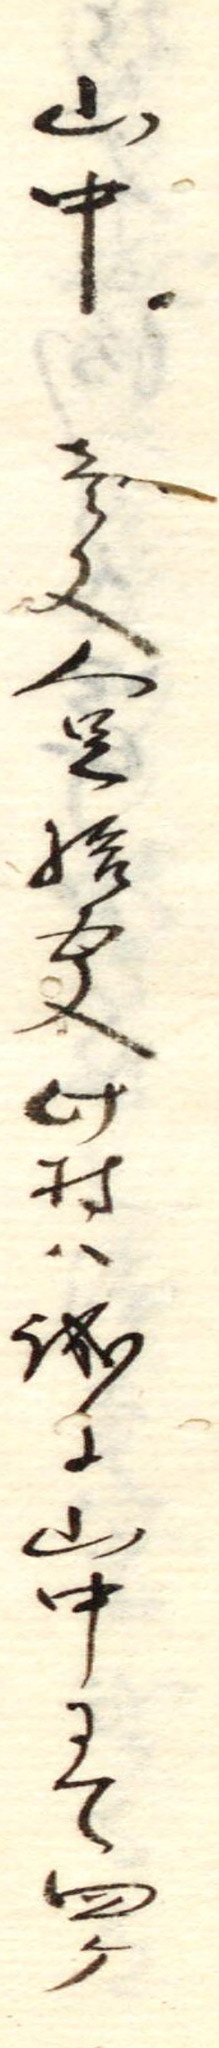山中壱文人足拾五文此村は誠に山中にて四ヶ
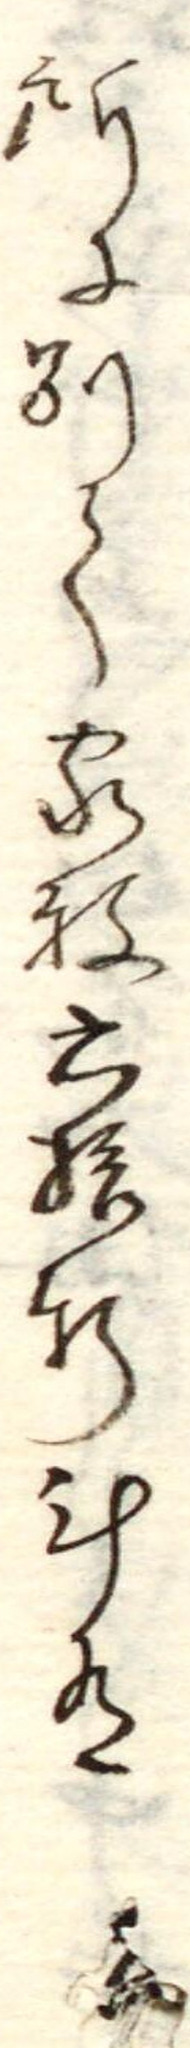所に別て家数六拾軒斗有
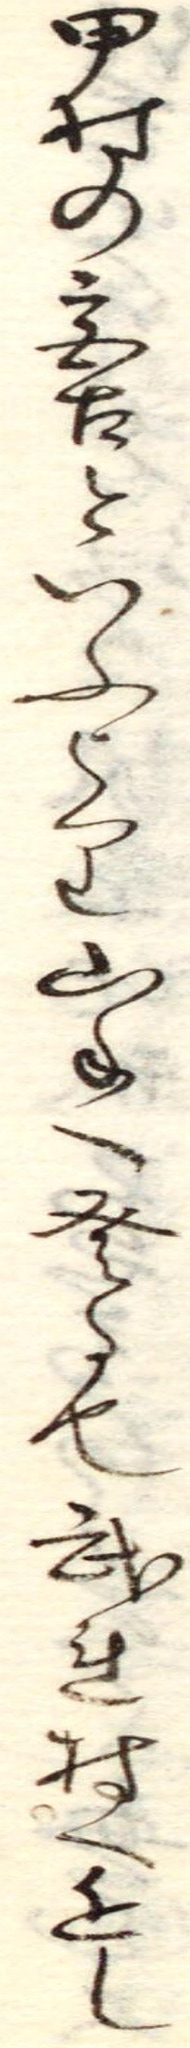甲村の宮古といふより山手へ登る也武連村へ近し
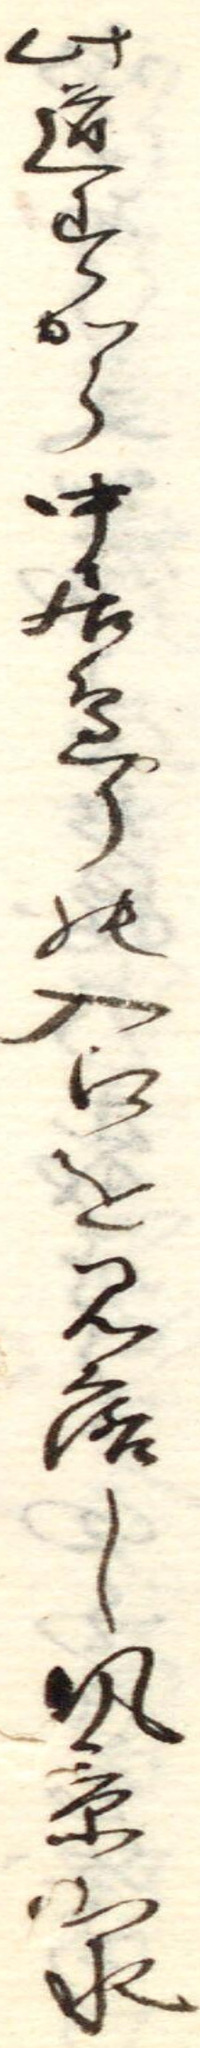此道すから中居辺りの入口を見落し風景山水
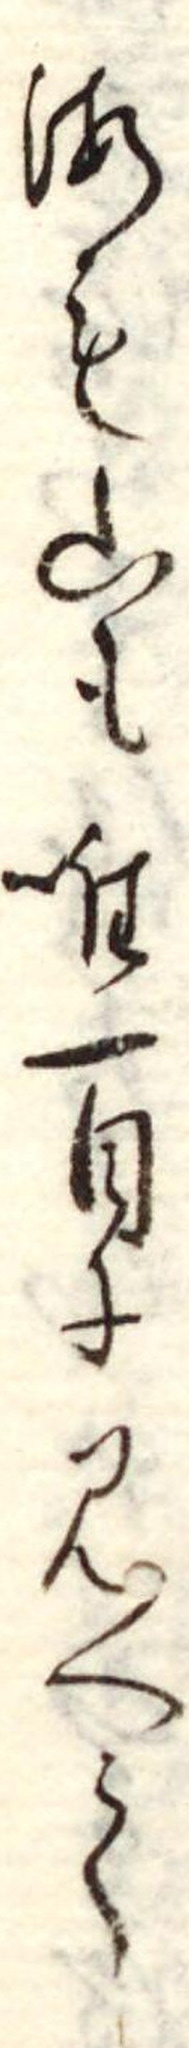海も山も唯一目に見へて
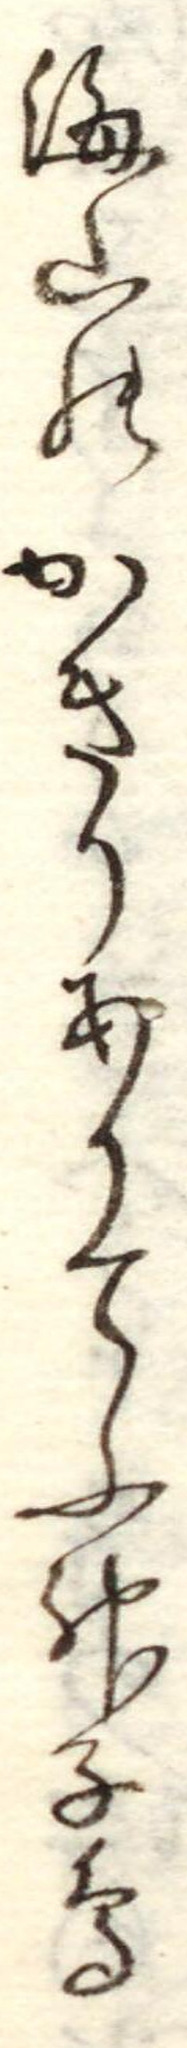海山のかきりありてふ神子島
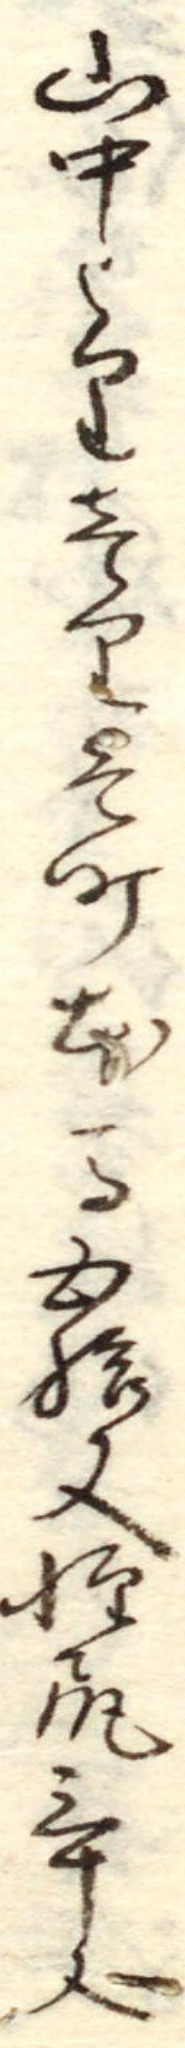山中より壱里壱町本馬五拾文軽尻三十文
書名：能登名跡誌
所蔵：Ishikawa Prefectural Library
